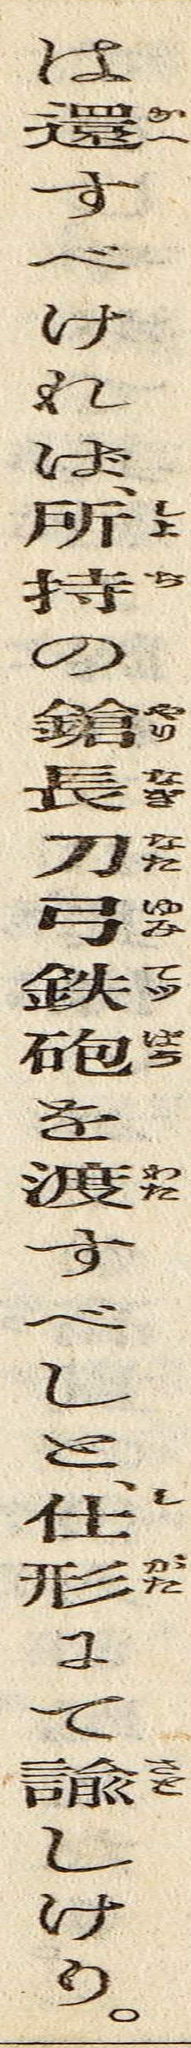は還すべければ、所持の鑓長刀弓鉄砲を渡すべしと、仕形にて諭しけり。
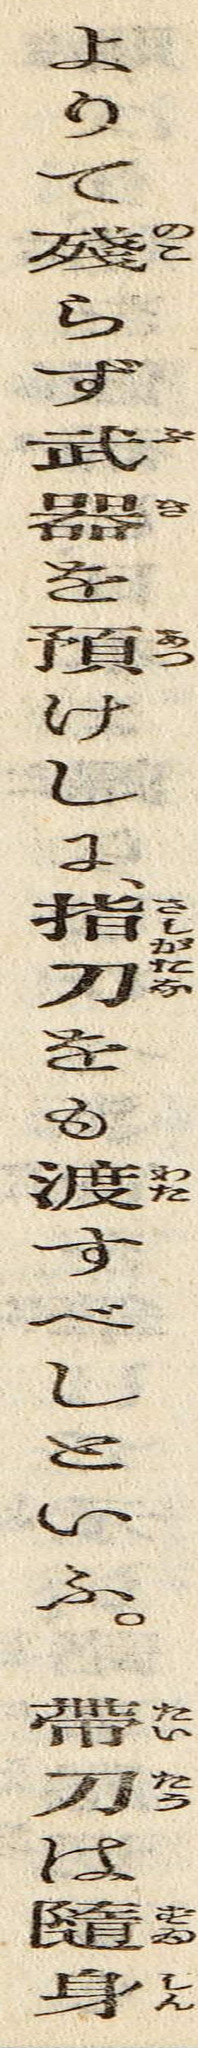よりて残らず武器を預けしに、指刀をも渡すべしといふ。帯刀は随身
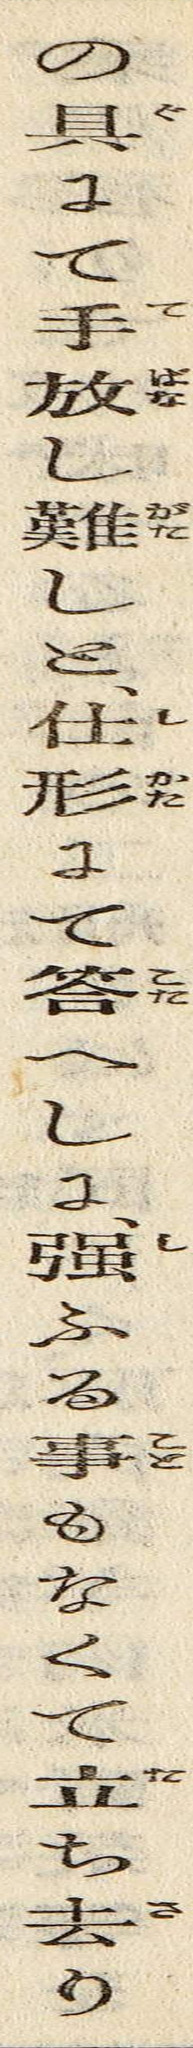の具にて手放し難しと、仕形にて答へしに、強ふる事もなくて立ち去り
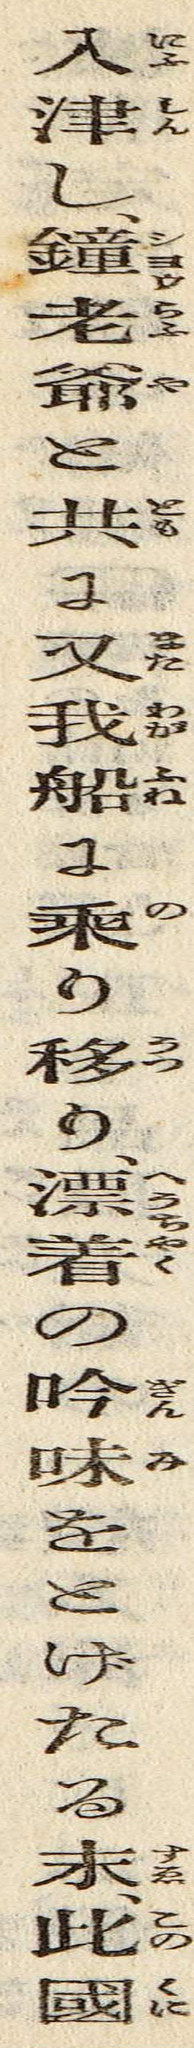入津し、鐘老爺と共に又我船に乗り移り、漂着の吟味をとげたる末、此国
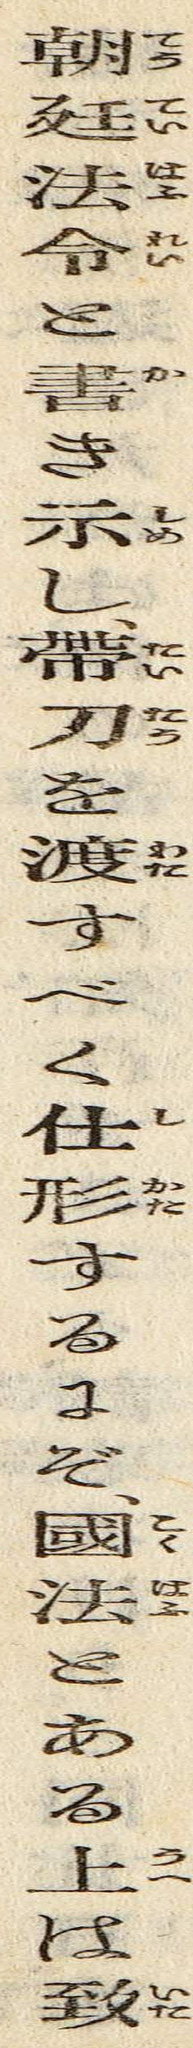朝廷法令と書き示し、帯刀を渡すべく仕形するにぞ、国法とある上は致
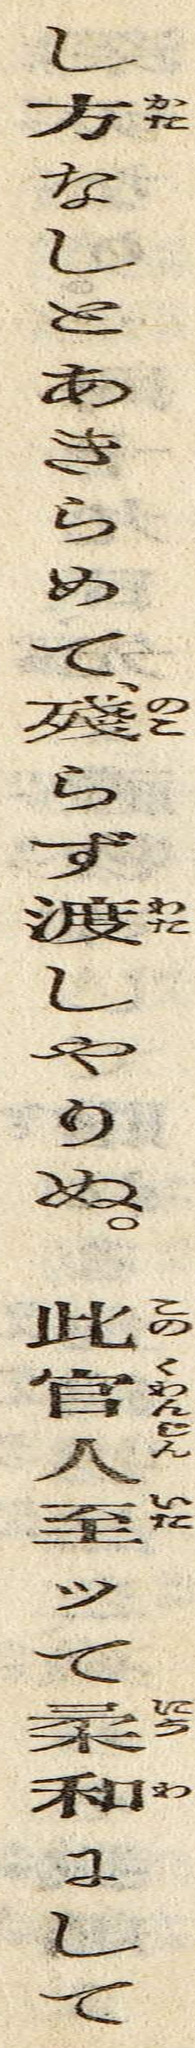し方なしとあきらめて、残らず渡しやりぬ。此官人至ツて柔和にして

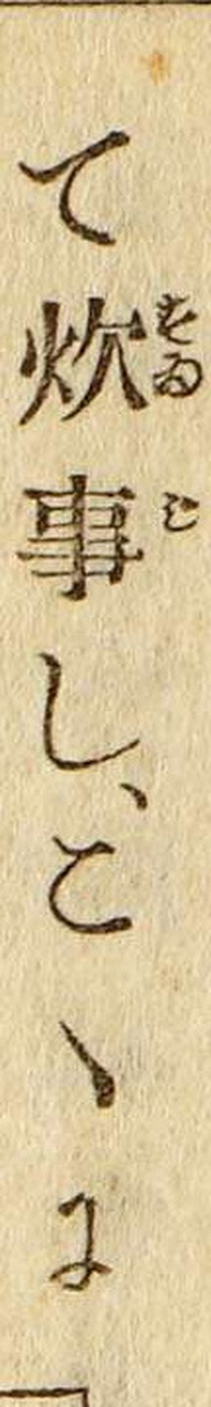て炊事しこゝに
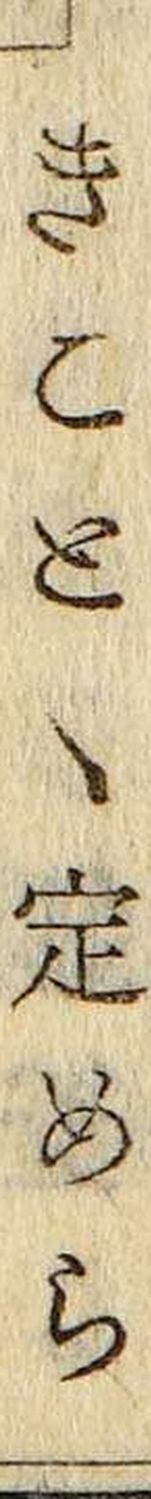きことヽ定めら
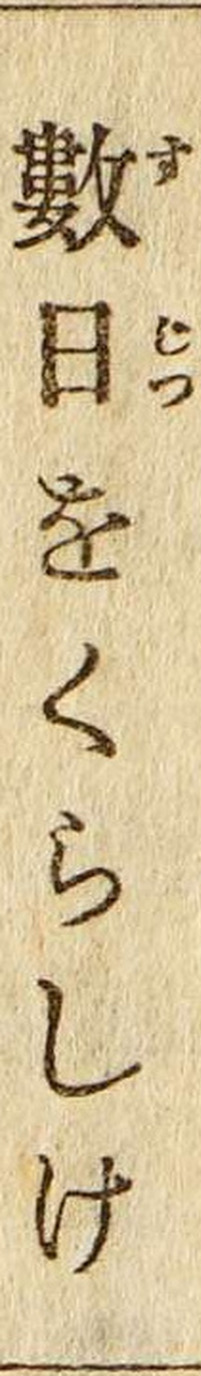数日をくらしけ
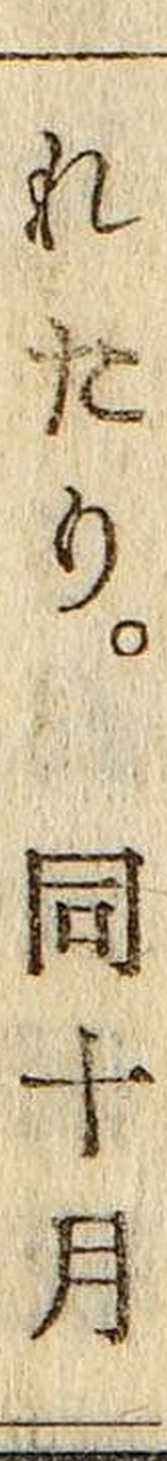れたり。同十月
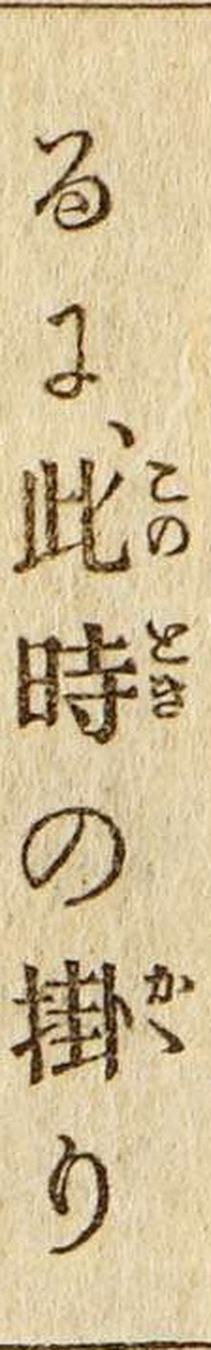るに此時の掛り
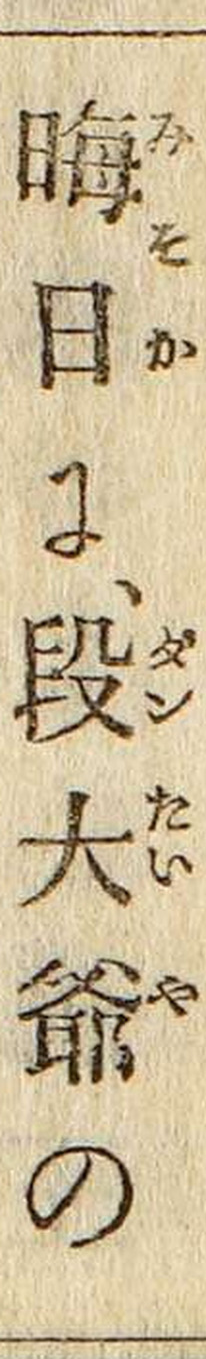晦日に段大爺の
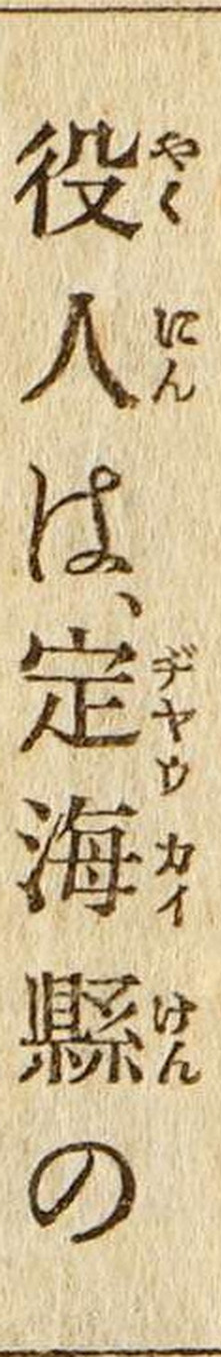役人は定海県の
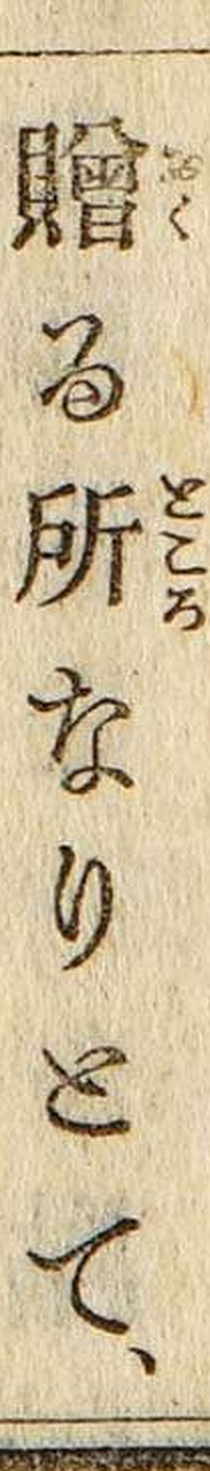贈る所なりとて、
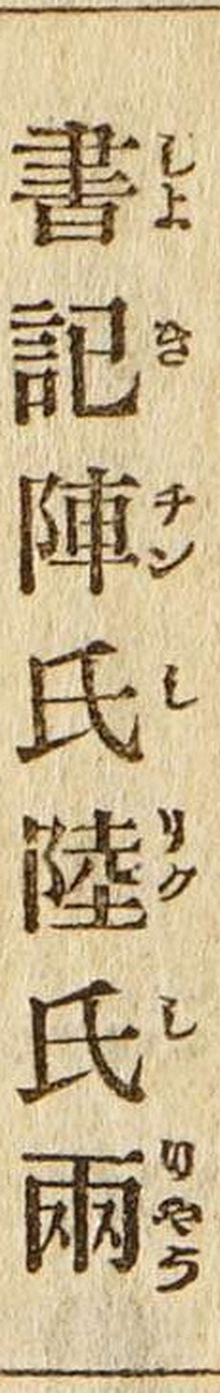書記陣氏陸氏両
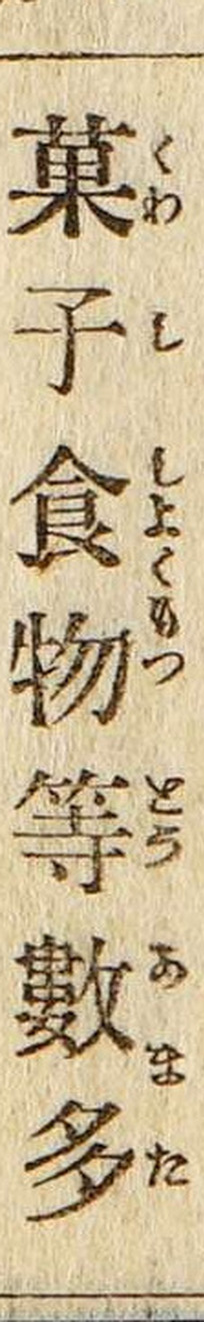菓子食物等数多
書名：日本漂流譚
